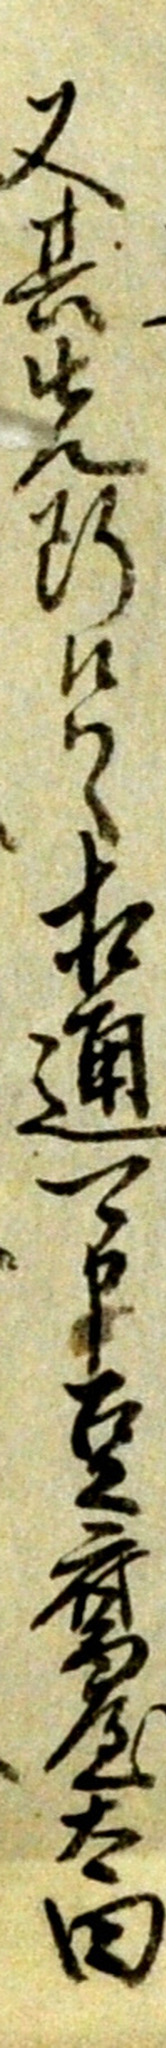又其先断候ハヽ相通可申豆腐屋太田
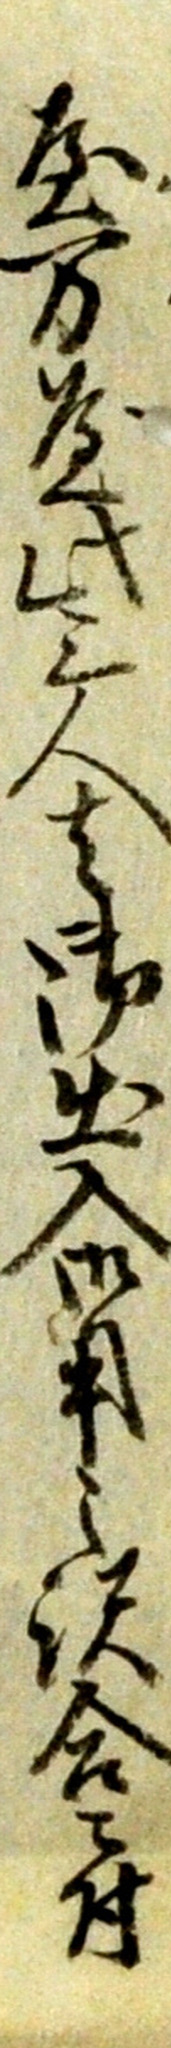屋万屋此三人者御出入御用之訳合ニ付
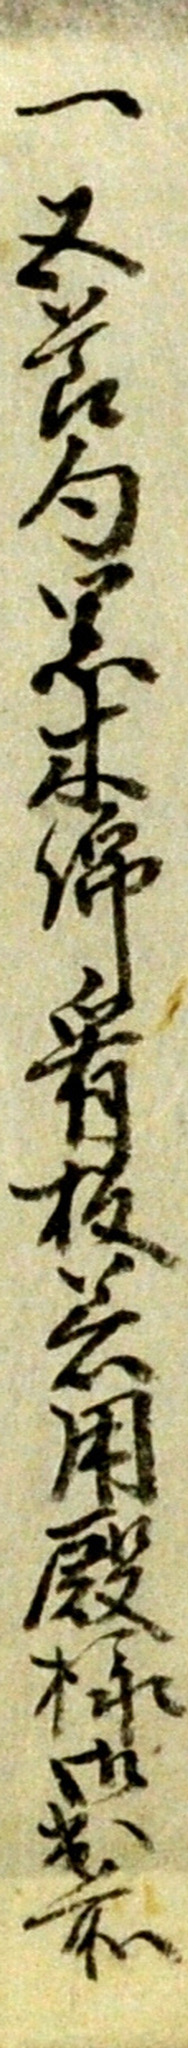一五節句黒木綿看板着用殿様御出所
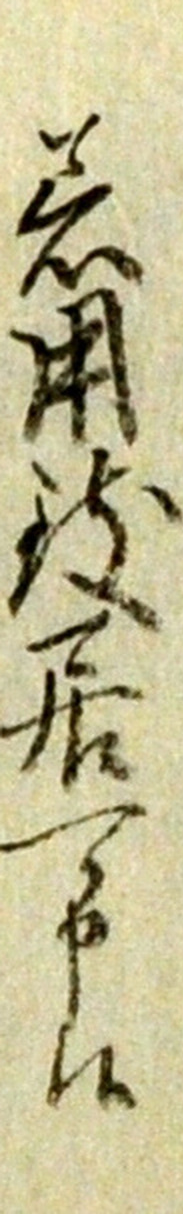着用致居可申候
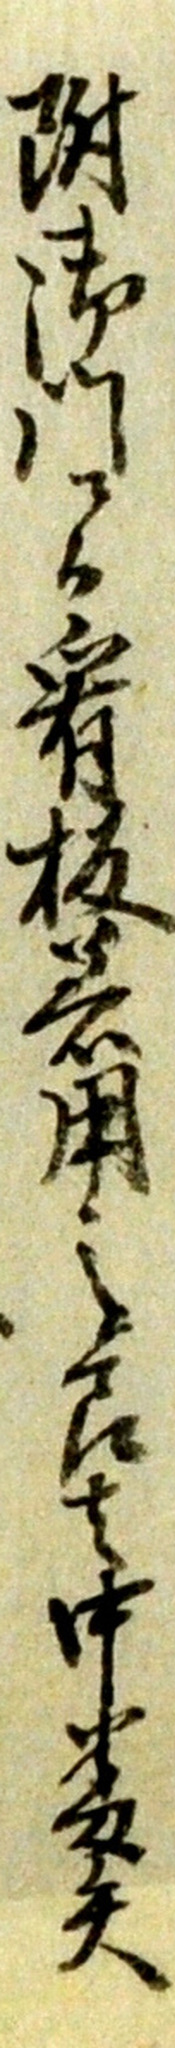附御門ニ看板着用之節者中番矢
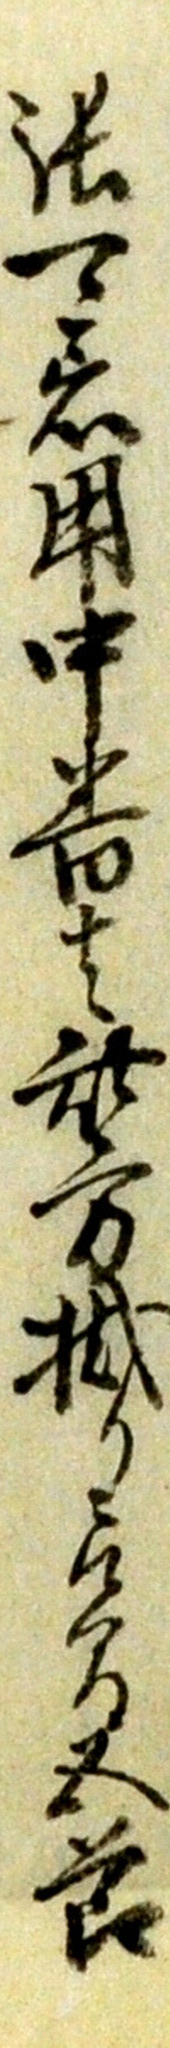張可着用中番者此方掛りニ候間五節
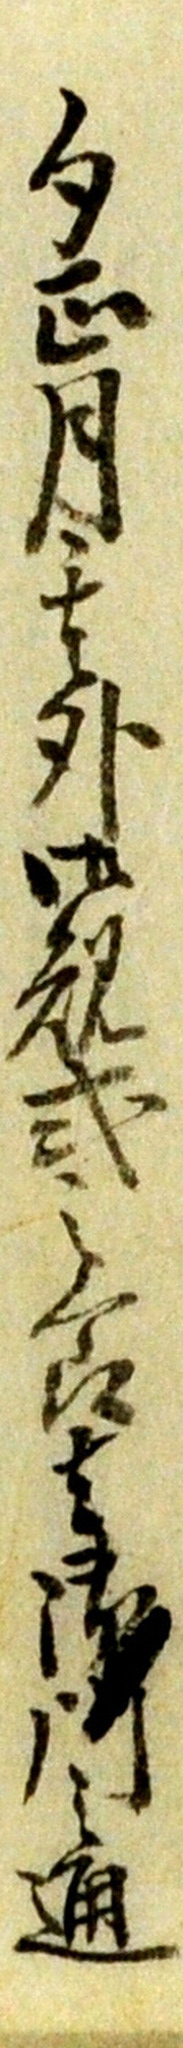句正月其外御規式之節者御門之通
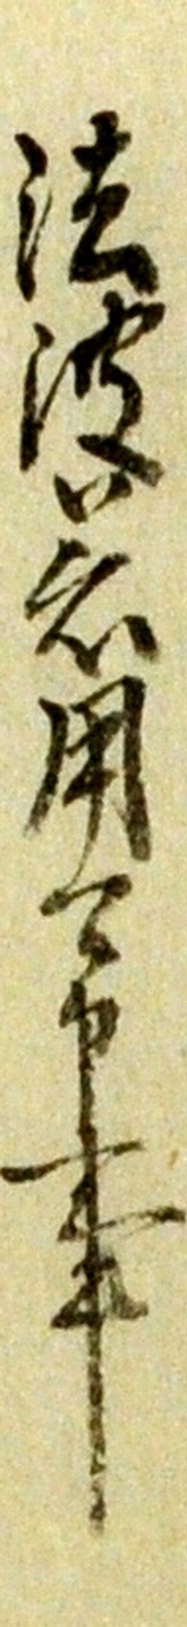法彼着用可申事
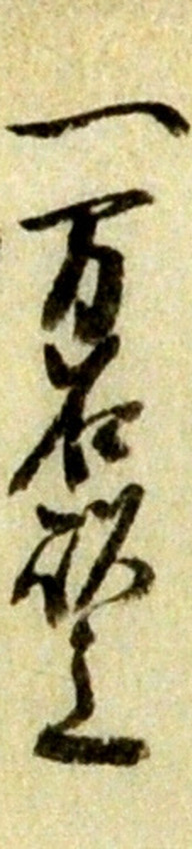一万石以上
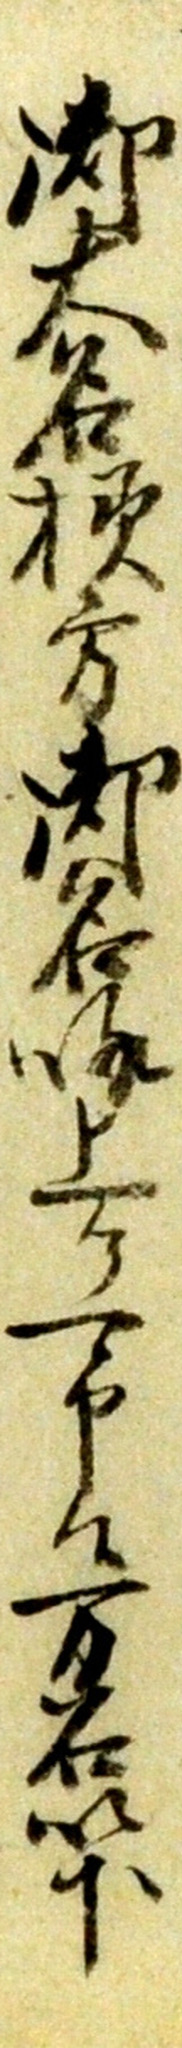御大名様方御名呼上ケ可申候万石以下
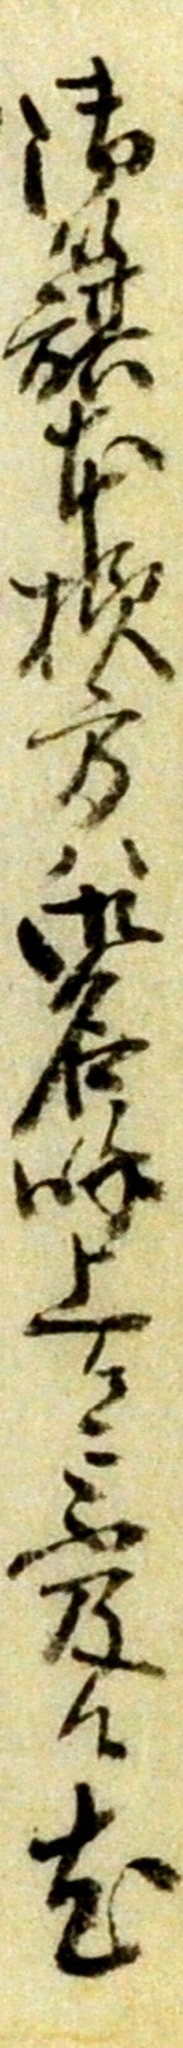御旗本様方ハ御名呼上ケニ不及候尤
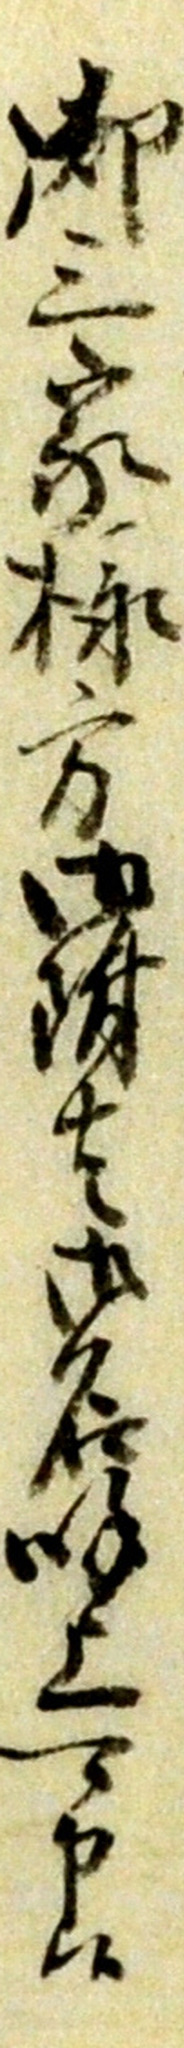御三家様方御附者御名呼上可申候
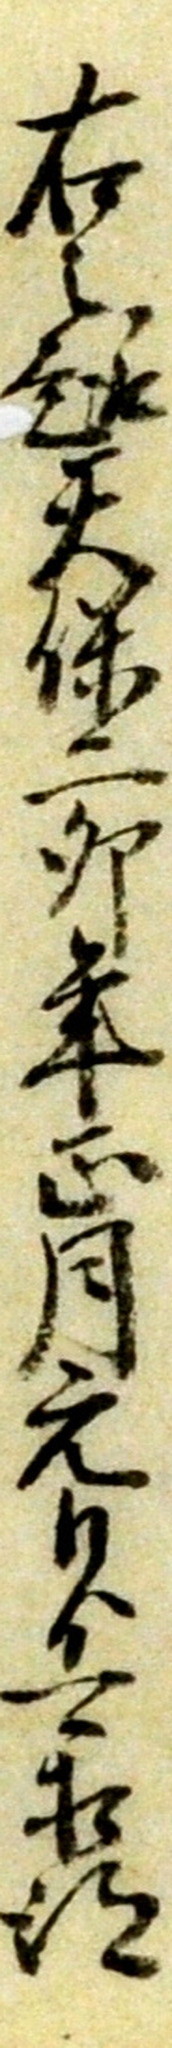右之趣天保二卯年正月元日ゟ可相得
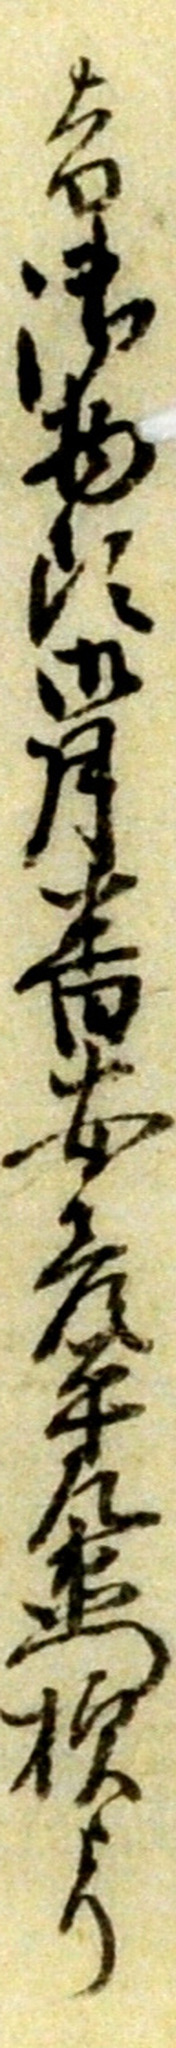旨御物頭御月番安彦平左衛門様より
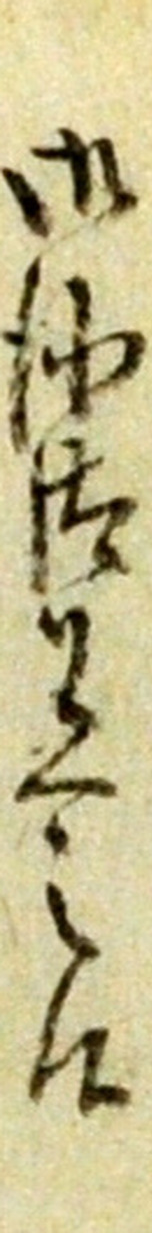御沙汰有之候
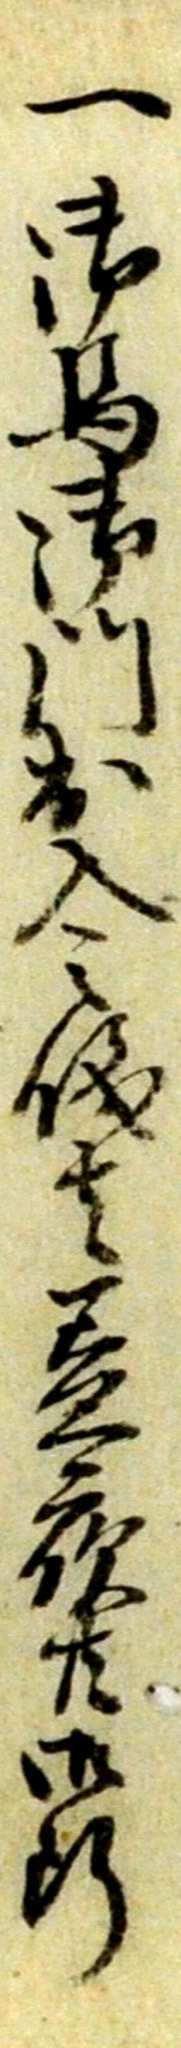一御馬御門出入之儀者昼夜共御断
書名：御先手組江戸御屋敷御門番勤方
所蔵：伊那市立高遠町図書館・合同会社AMANE
